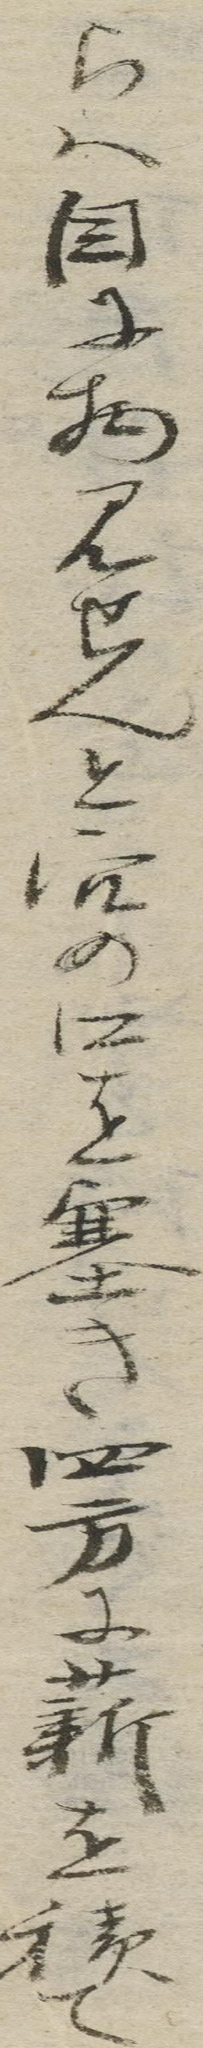らハ目に物見せんと穴の口を塞き四方に薪を積て
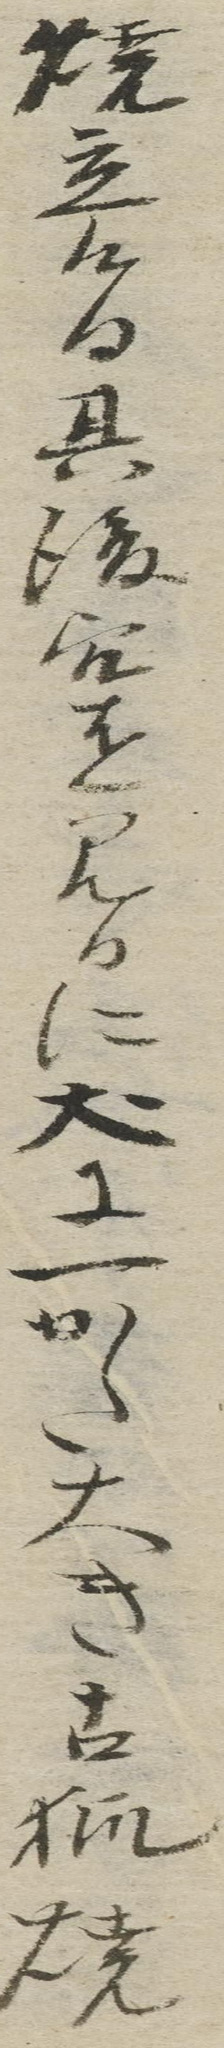焼立ける其後穴を見るに犬に一かた大き古狐焼
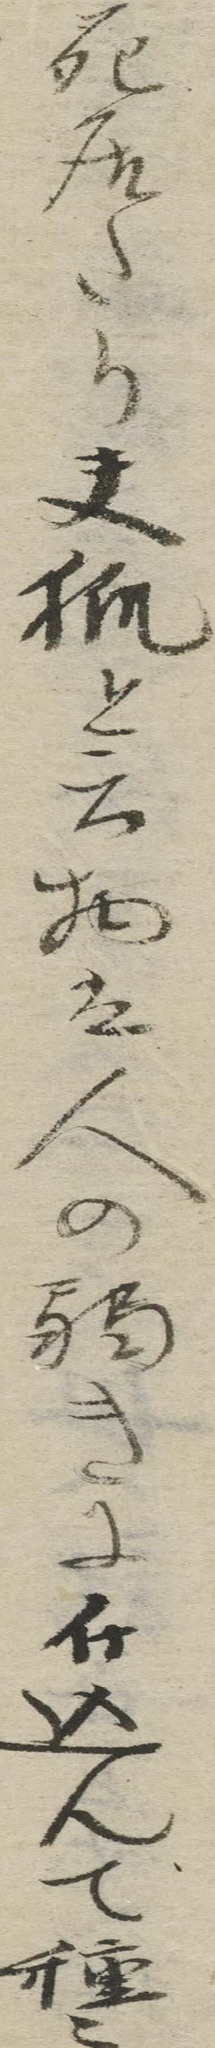死居たり夫狐と云物は人の弱きに付込んて種〻
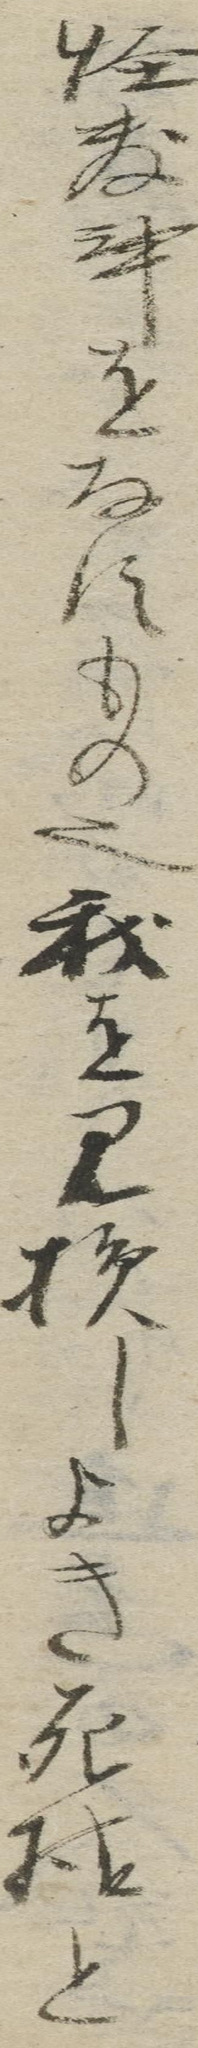怪敷事をなすもの也我を見損しよき死様と
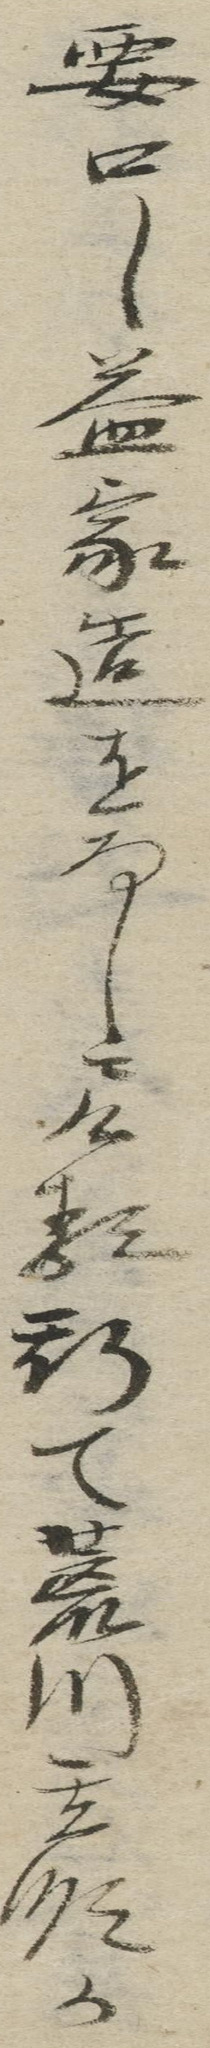要口し益家造をなしにける斯て荒川玄順か
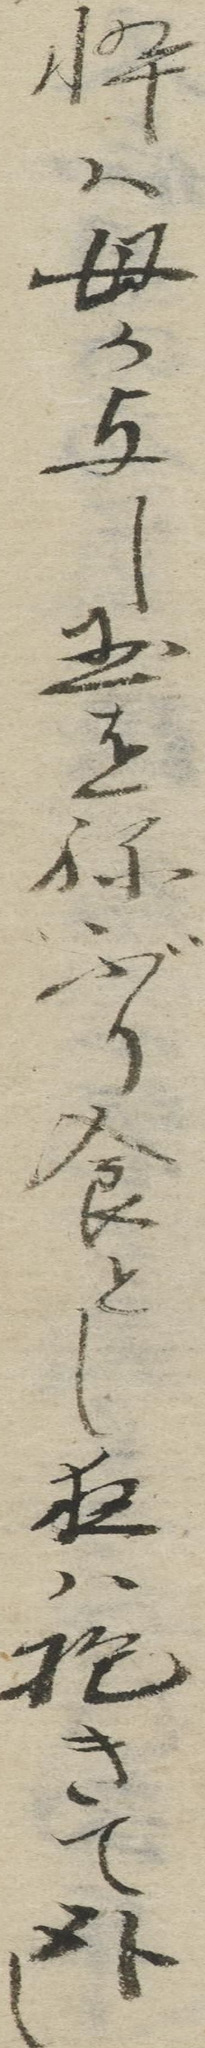忰ハ母か与し玉をねぶり食とし夜ハ抱きて臥し

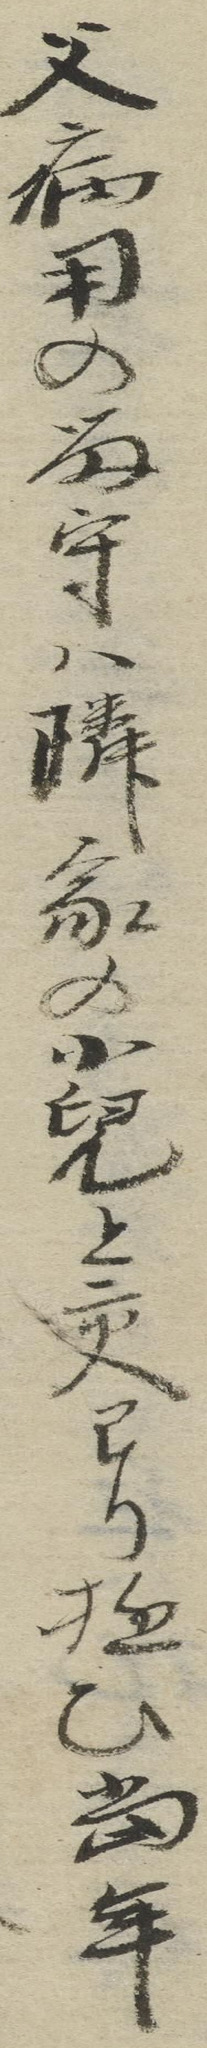父病用の留守ハ隣家の小児と交わり遊ひ当年
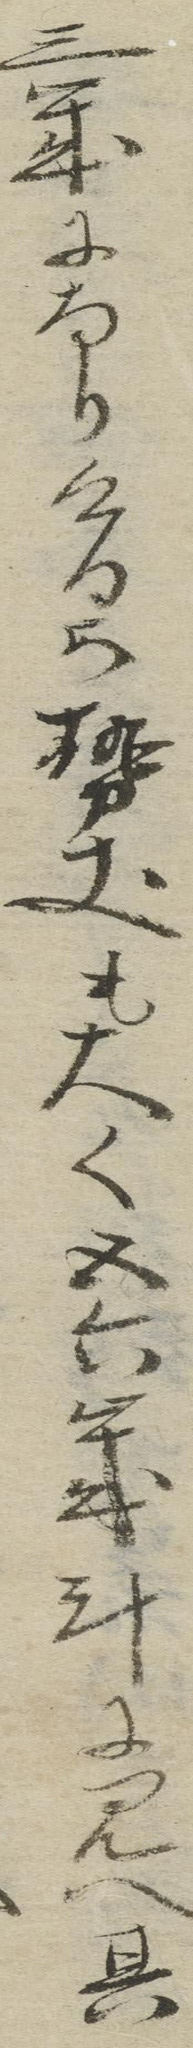三年になりけるが勢丈も大く五六年計に見へ其
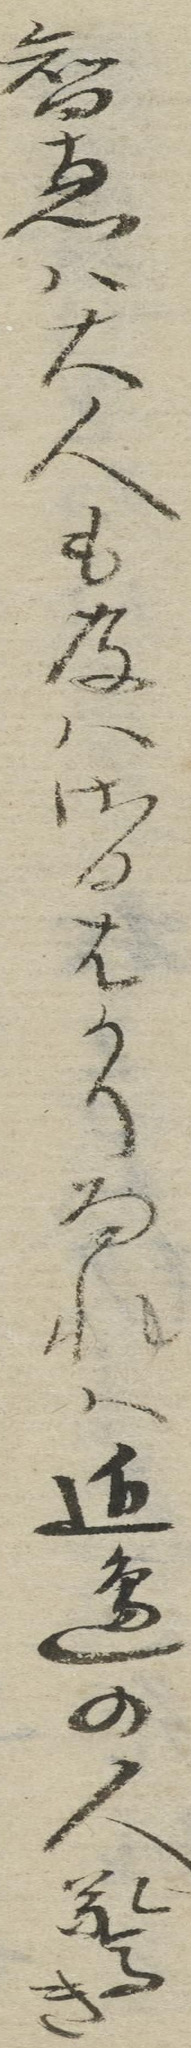智恵ハ大人も及ハさるはかりなれハ近辺の人驚き
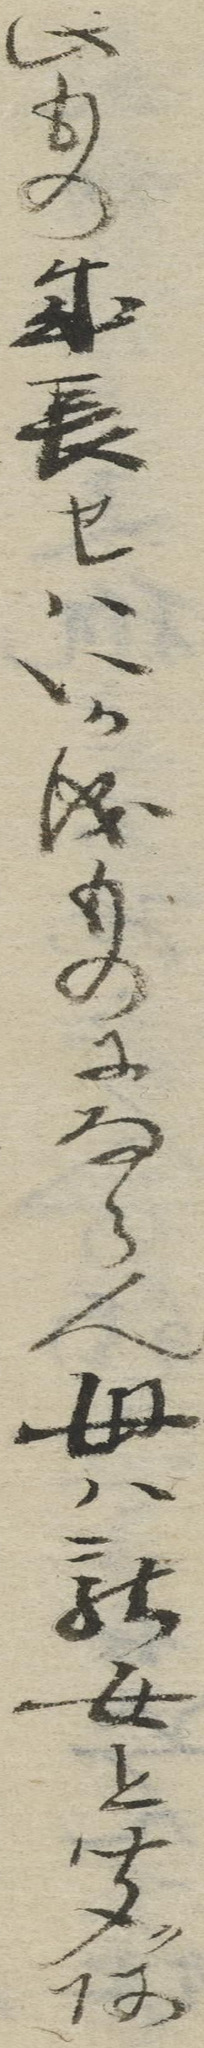此もの成長セハいか成ものにならん母ハ龍女と聞クあ
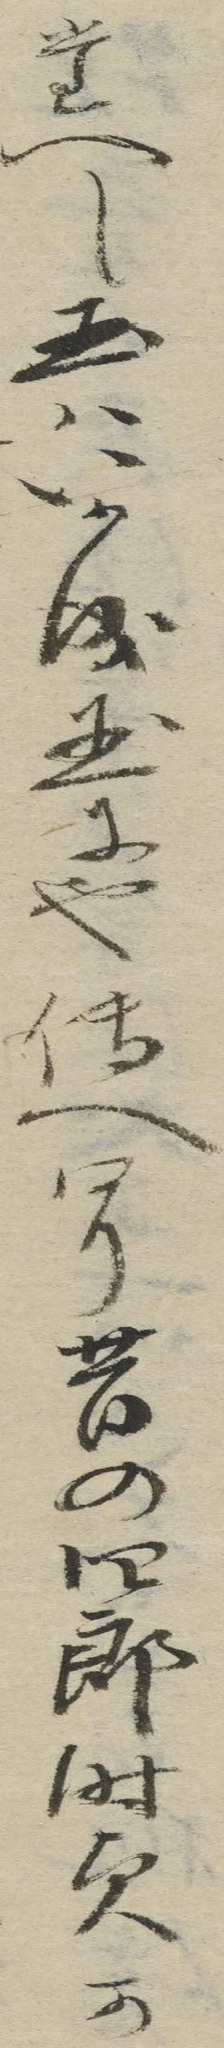たへし玉ハいか成玉にや伝へたり昔の四郎時貞か
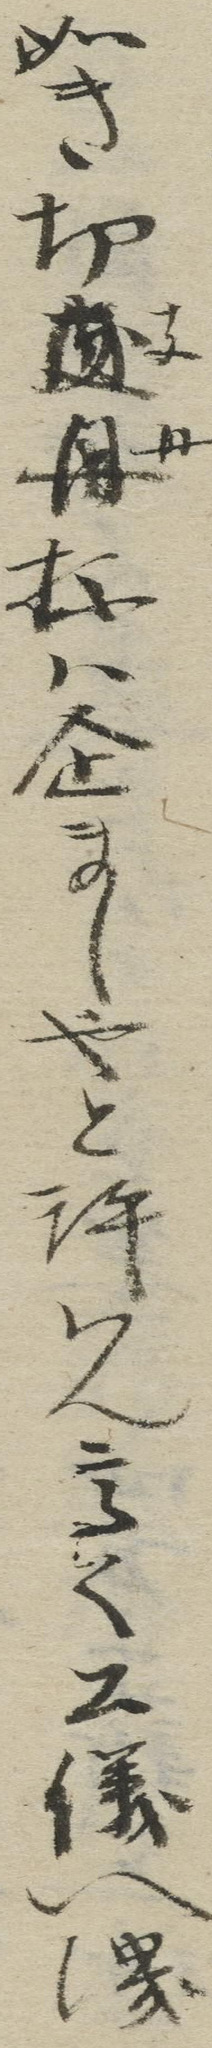如き切支丹抔ハ企ましやと評ハン高く公儀へ洩
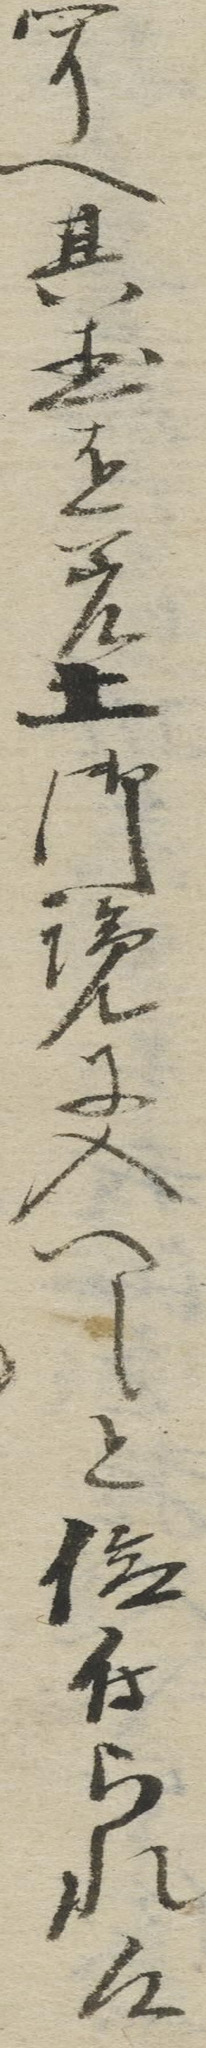聞へ其玉を差上御覧に入へしと仰付られけ
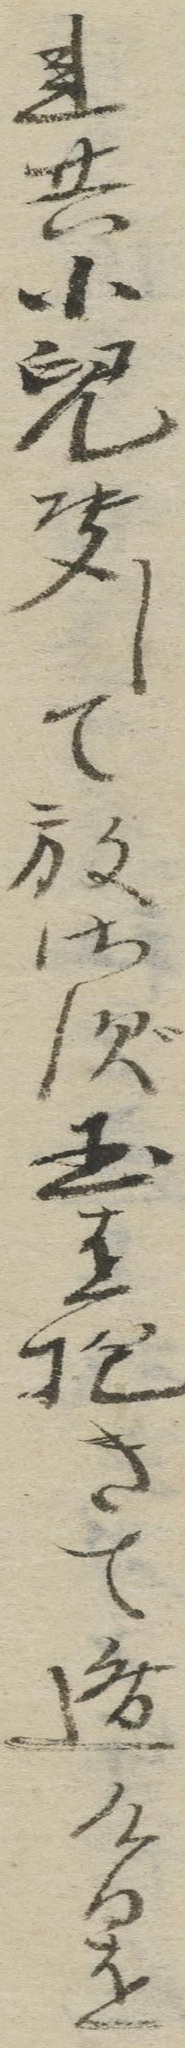れ共小児決して放さず玉を抱きて遁けるを
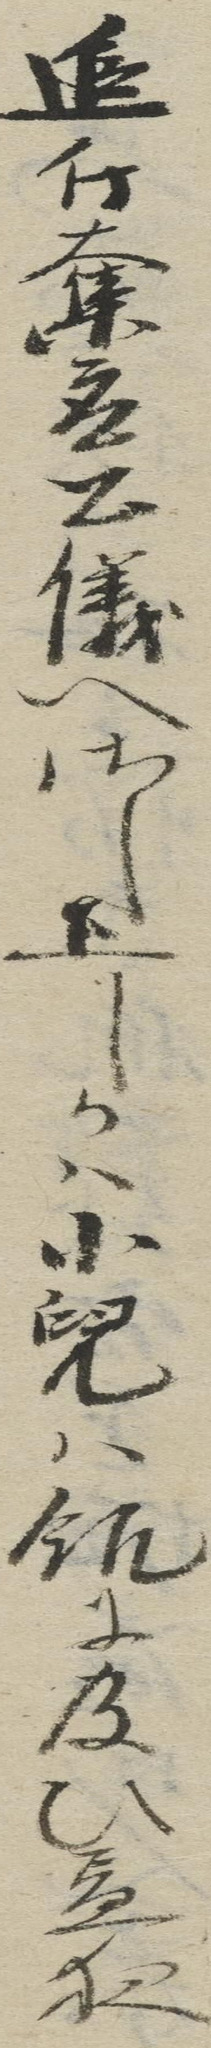追付奪取公儀へさし上しかハ小児ハ飢に及ひ昼夜
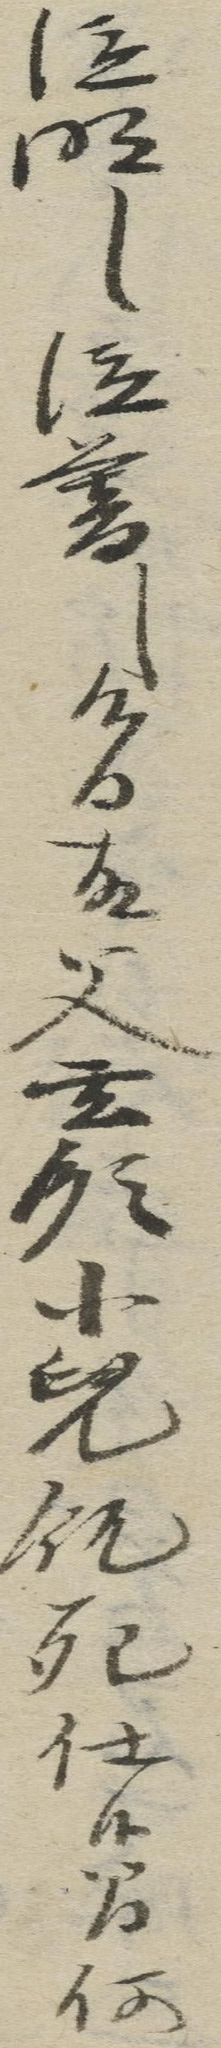泣明し泣暮しける故父玄順小児飢死仕候間何
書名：肥前國島原領普賢山大変記　完
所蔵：東京大学地震研究所図書室 Earthquake Research Institute Library, The University of Tokyo, JAPAN
